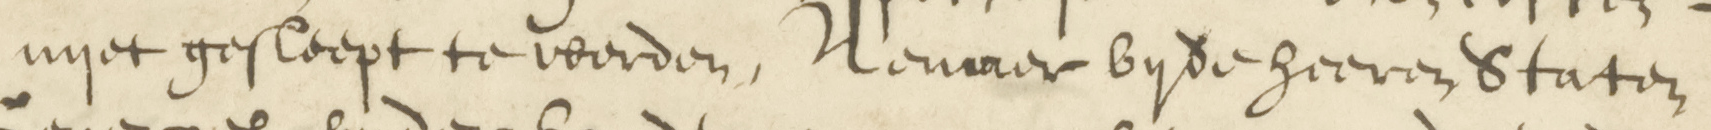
nyet gesleept te werden, Nemaer byde heeren Staten
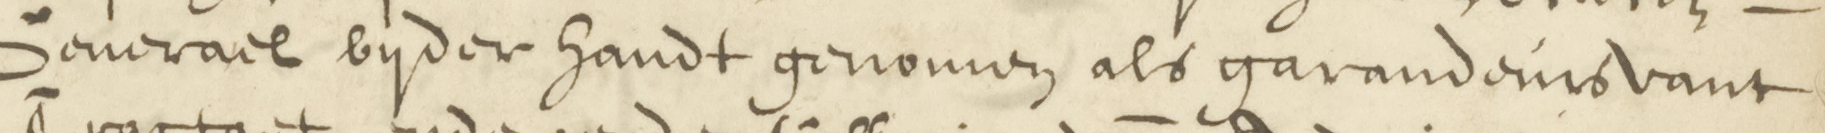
Generael byder handt genomen als garandeurs vant
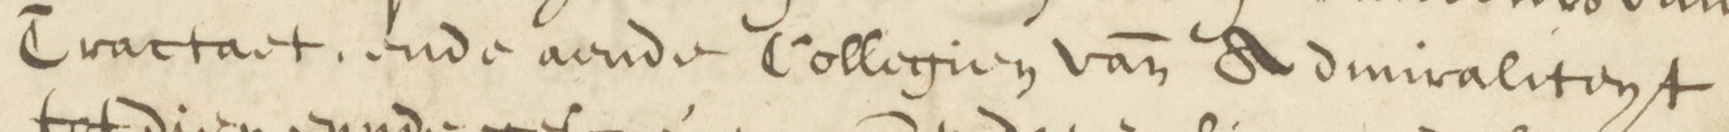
Tractaet, ende aende Collegien van Admiraliteyt
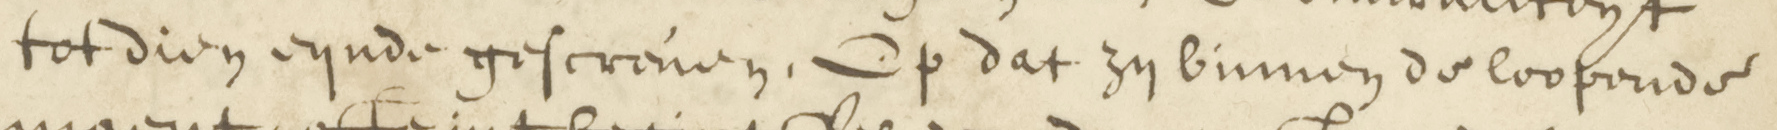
tot dien eynde gescreuen. Op dat zy binnen de loopende
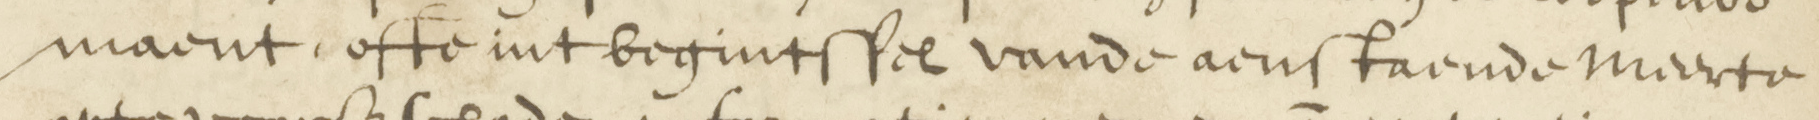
maent, ofte int begintssel vande aenstaende meerte
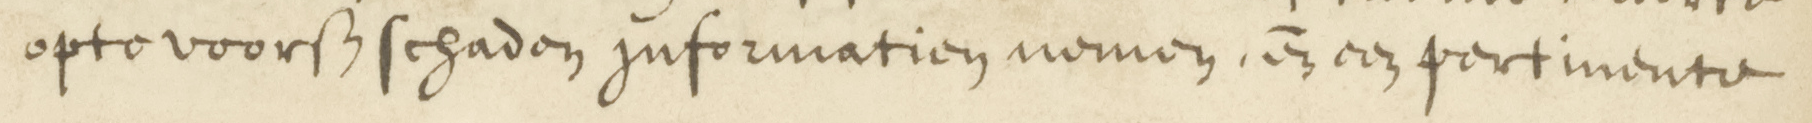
opte voors schaden informatien nemen, en een pertinente
